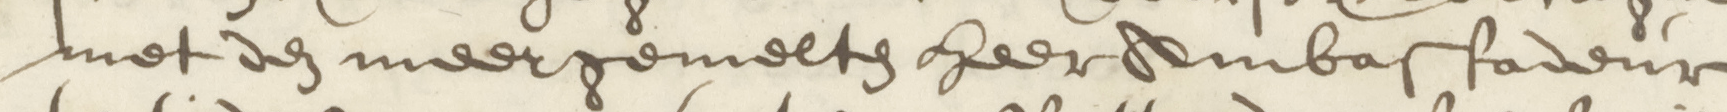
met den meergemelten heer Ambassadeur
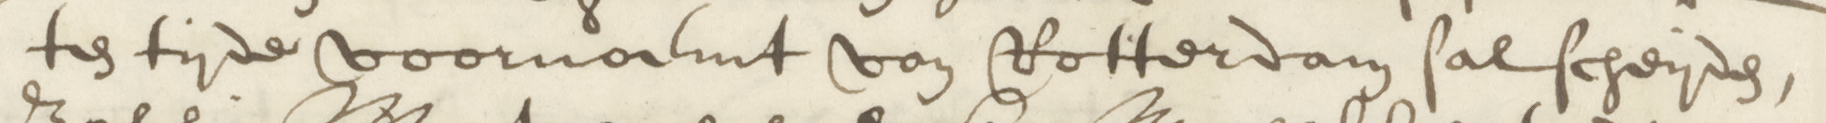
ten tijde voornoemt van Rotterdam sal scheijden,
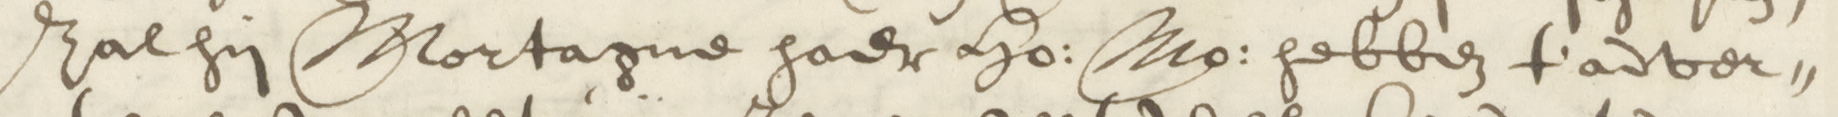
zal hij Mortagne haer Ho:Mo: hebben t' adver„
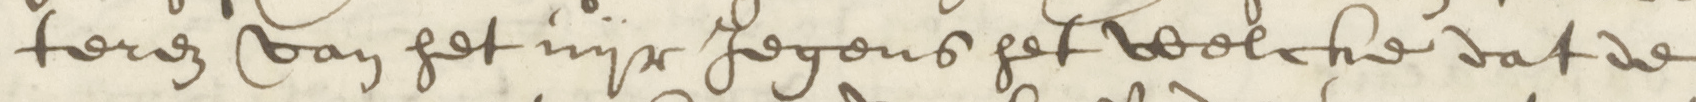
teren van het uijr Jegens het welcke dat de
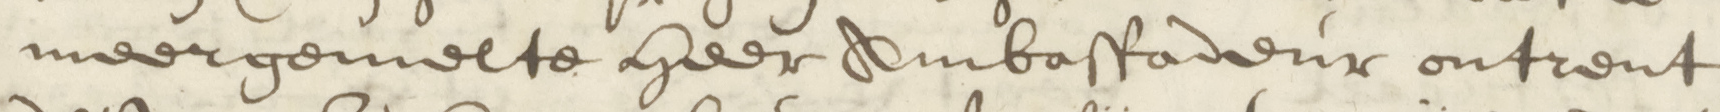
meergemelte heer Ambassadeur ontrent
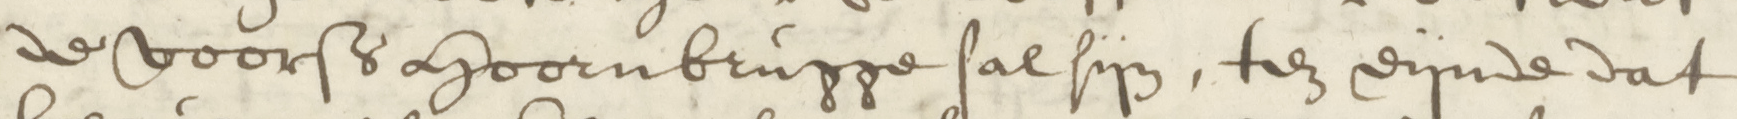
de voorsz Hoornbrugge sal sijn, ten eijnde dat
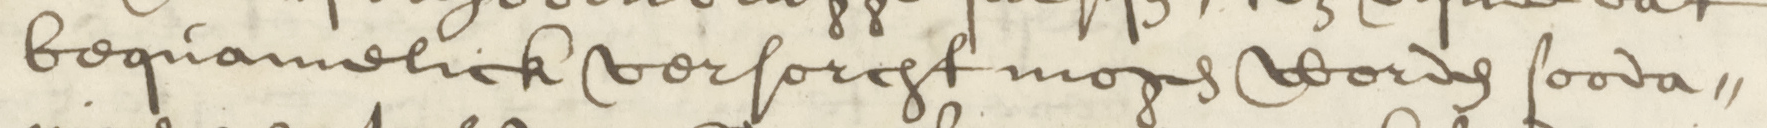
bequaemelick versorcht mogen worden sooda„
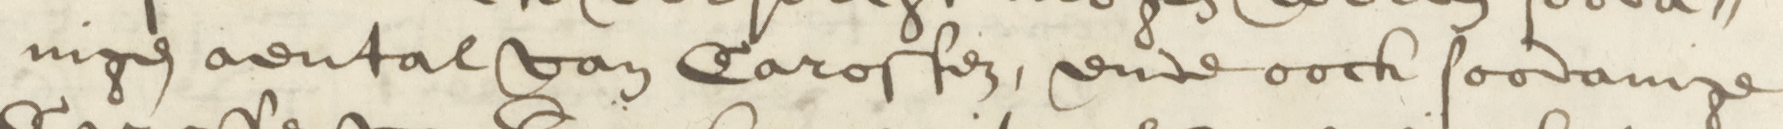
nigen aental van Carossen, ende oock soodanige
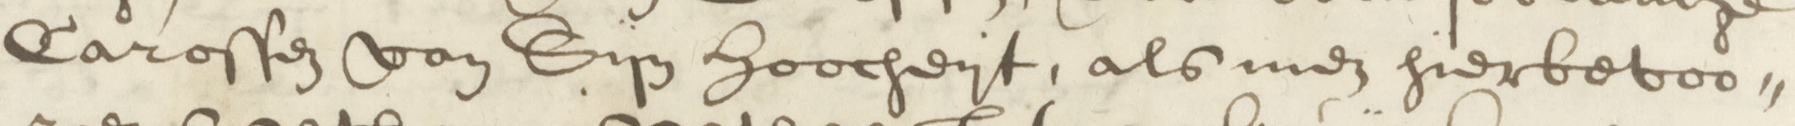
Carossen van Sijn Hoocheijt, als men hierbevoo„
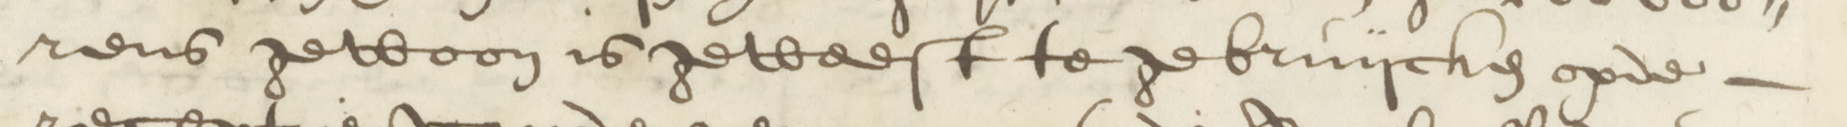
rens gewoon is geweest te gebruijcken opde —
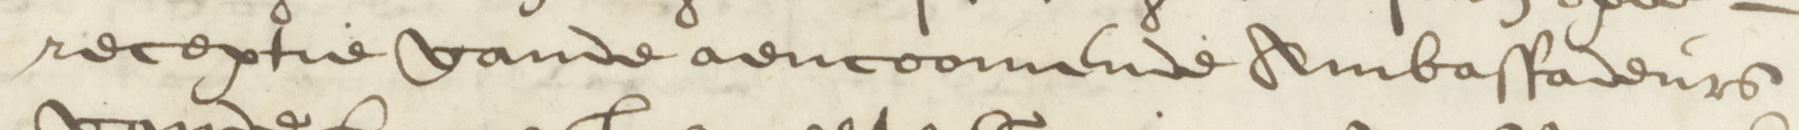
receptie vande aencoomende Ambassadeurs
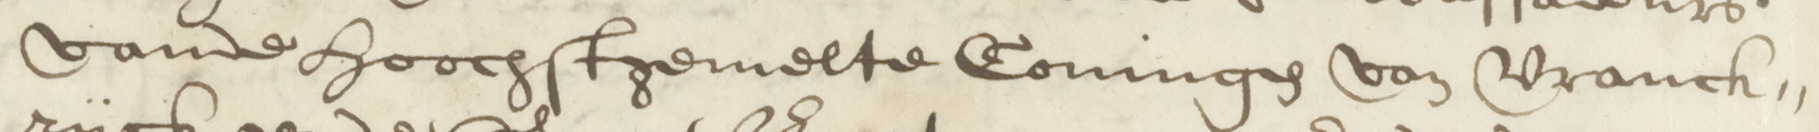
vande Hoochstgemelte Coningen van Vranck„
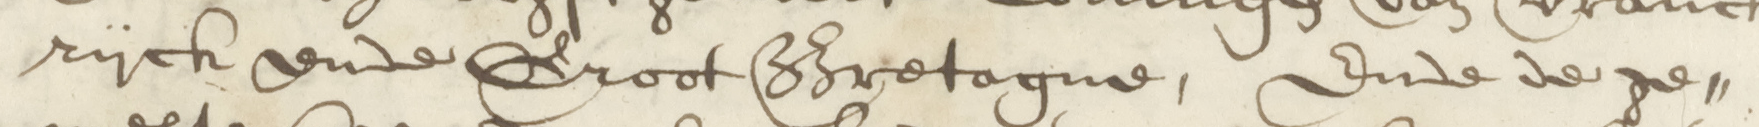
rijck ende Groot Bretagne. Ende de ge„
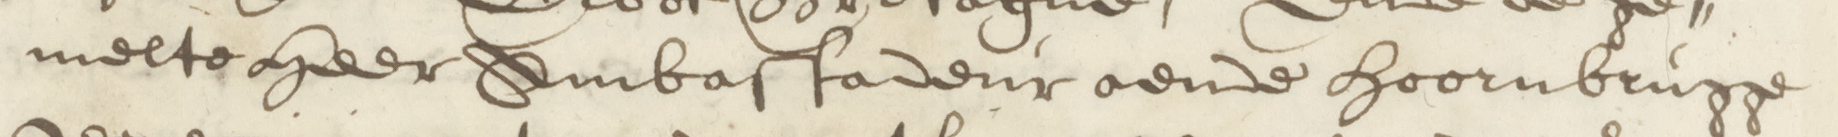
melte heer Ambassadeur aende Hoornbrugge
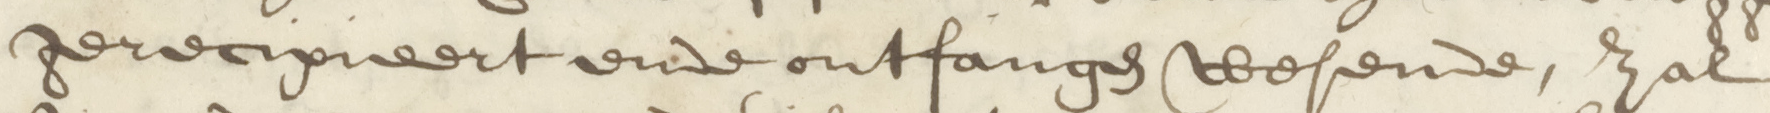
gerecipieert ende ontfangen wesende, zal
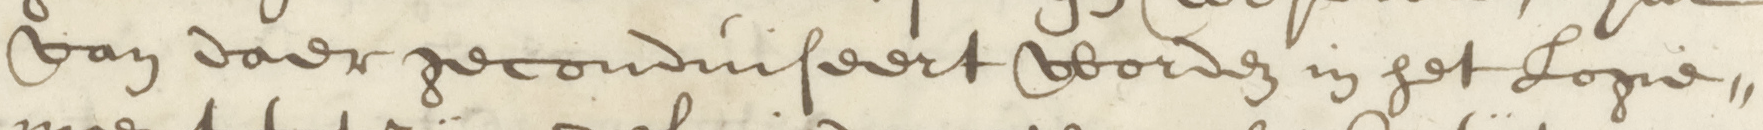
van daer geconduiseert worden in het Logie„
